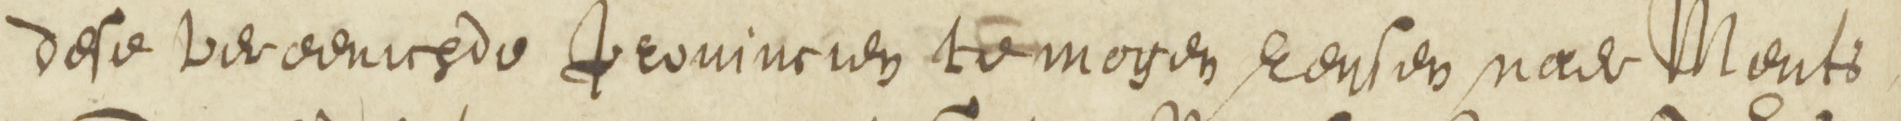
dese vereenichde prouincien te mogen reysen, naer Ments
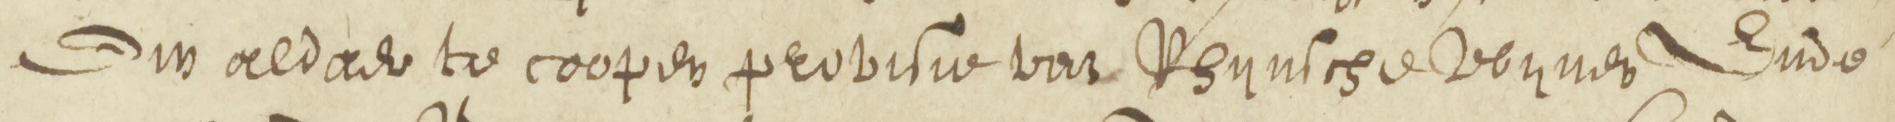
om aldaer te coopen provisie van Rhynsche wynen Ende
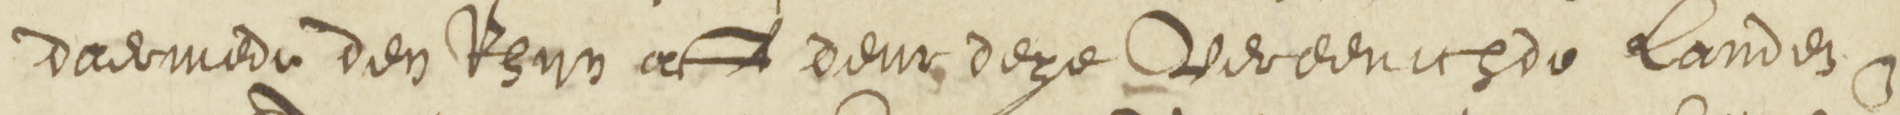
daermede den Ryn aff deur deze Vereenichde Landen
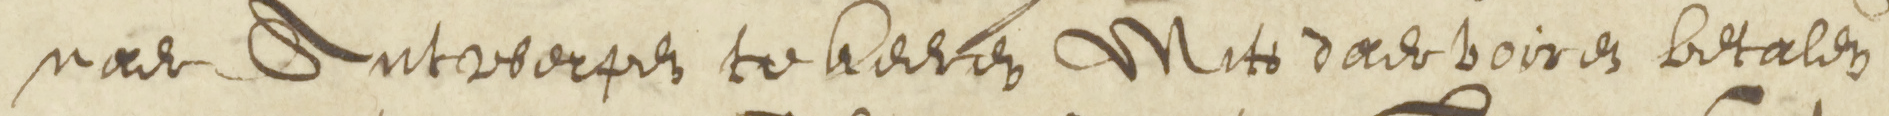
naer Antwerpen te keeren mits daervoiren betalen
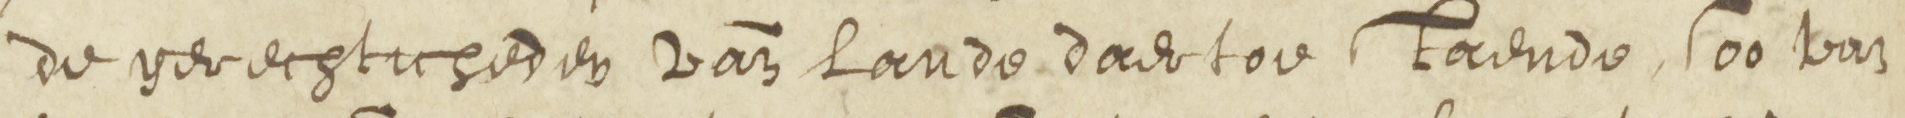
de gerechticheden van lande daertoe staende, soo van
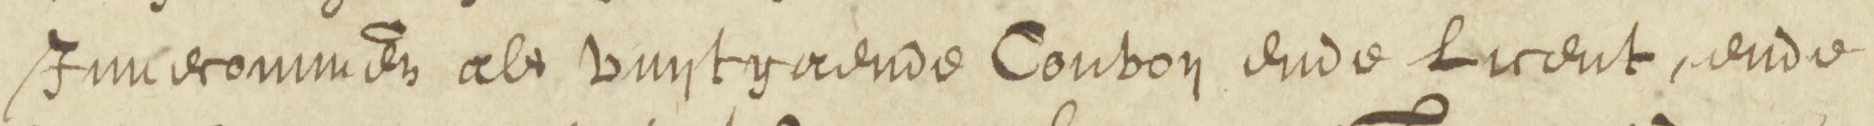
Innecommen als vuytgaende Convoy ende Licent, ende
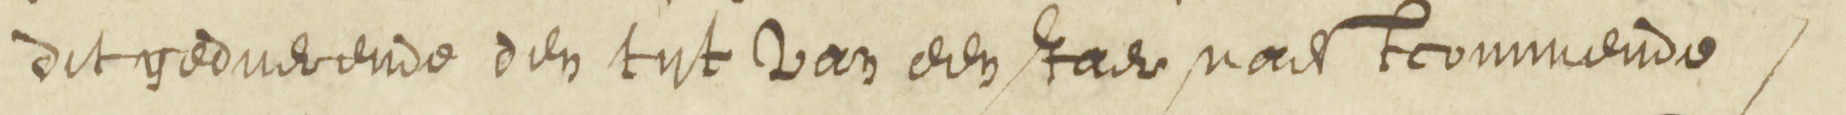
dit geduerende den tyt van een jaer naestcommende.
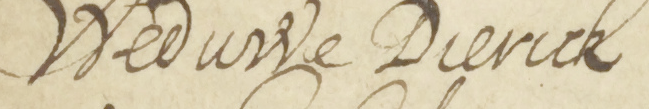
Weduwe Dierick
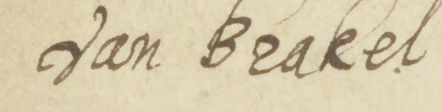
van Brakel
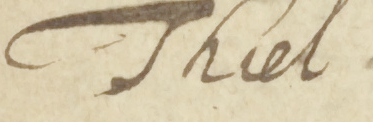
Thiel
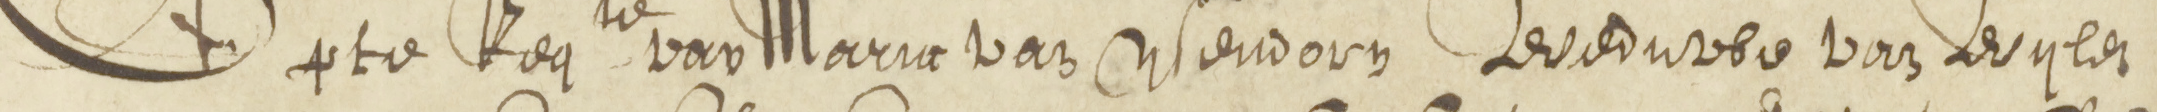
Opte Reqte van Maria van Ysendorn weduwe van wylen
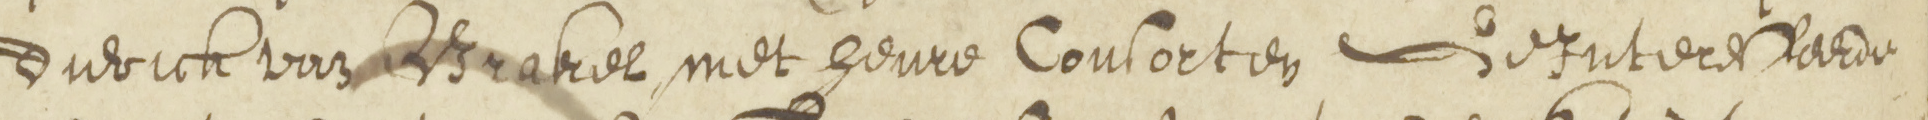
dierick van Brakel, met heure Consorten Geinteresteerde
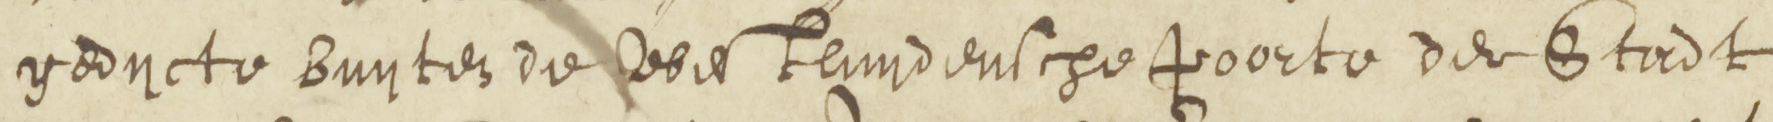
gedycte buyten de westluydensche poorte der Stadt
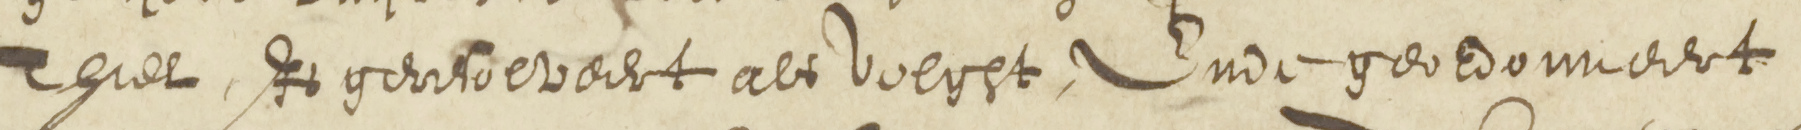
Thiel, Is geresolveert als volght. Ende geordonneert
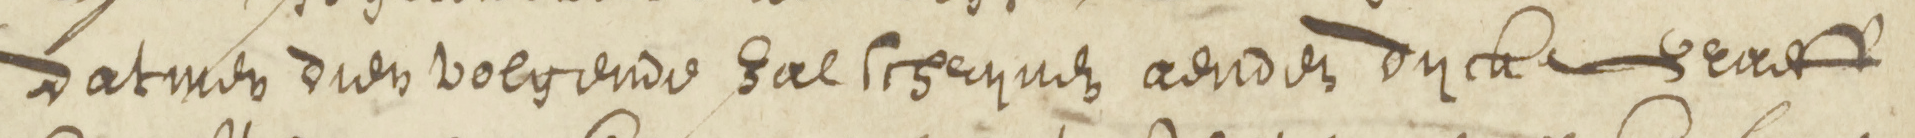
datmen dien volgende zal schryuen aenden dyckgraeff
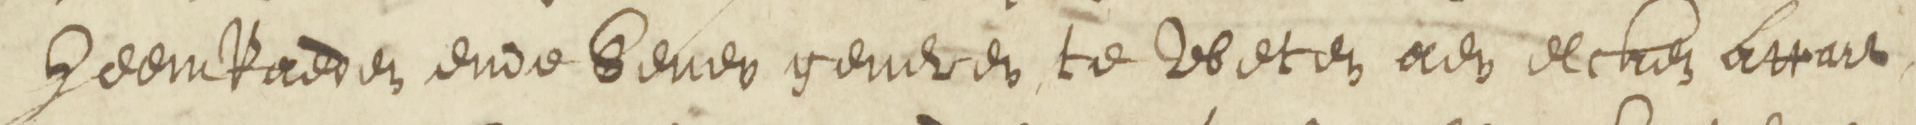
heemRaeden ende seven geueren te weten aen elcken appart
